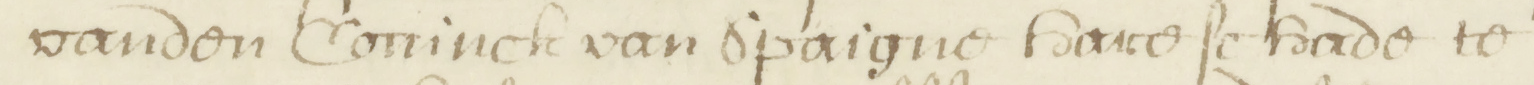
vanden Coninck van Spaigne hare schade te
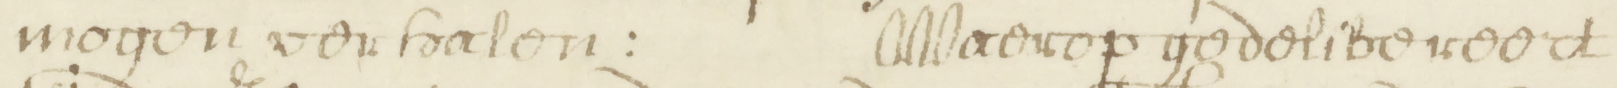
mogen verhalen: Waerop gedelibereert
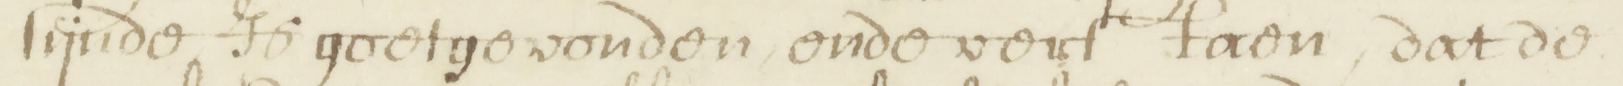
sijnde Is goetgevonden, ende verstaen, dat de
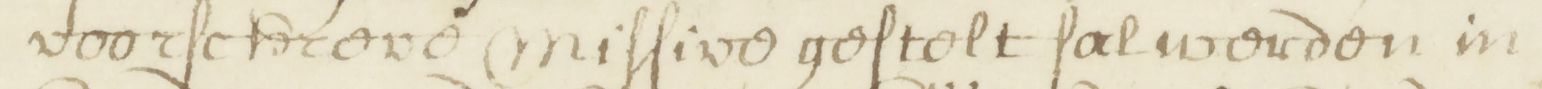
voorschreve Missive gestelt sal werden in
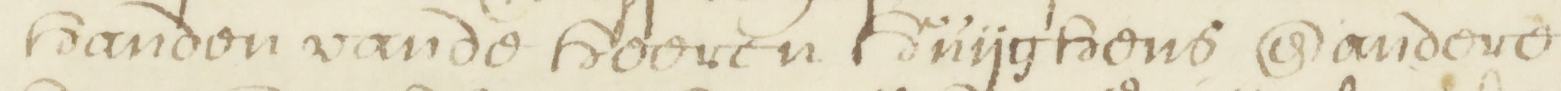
handen van de heeren Huijghens & andere
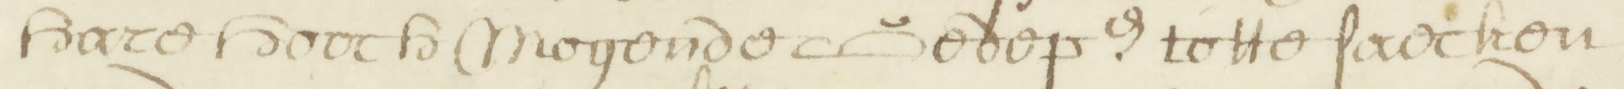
hare Hooch Mogende Gedepen. totte saecken
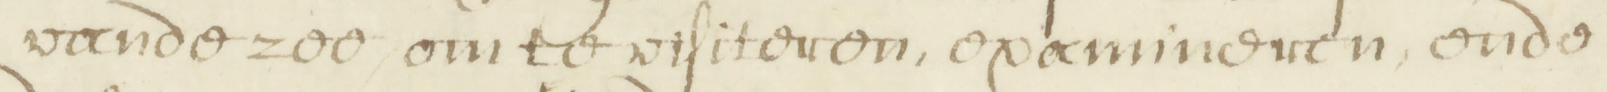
vande zee, om te visiteren, examineren, ende
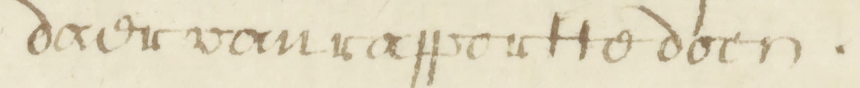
daer van rapport te doen.
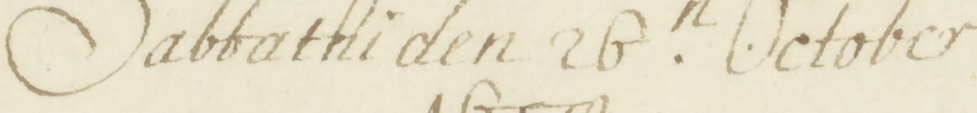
Sabbathi den 26n. October
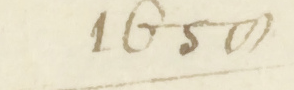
1658
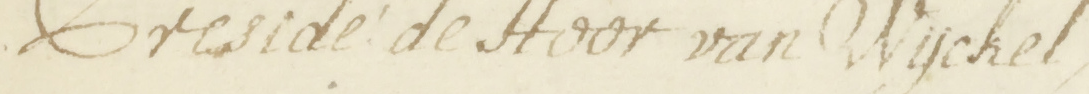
Preside de Heer van Wijckel,
